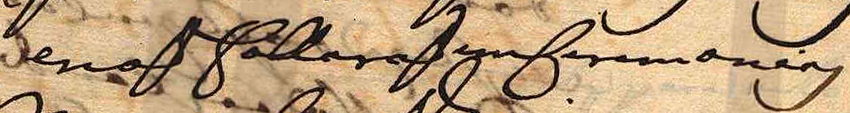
e naõ fallaraõ em Ceremonias
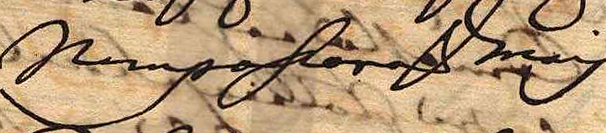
Nem passaraõ mais
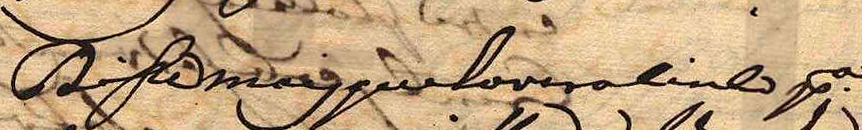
Disse mais que havera cinco p.a
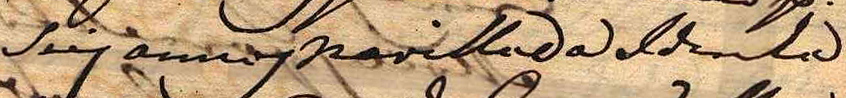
seis annos na villa da Idanha
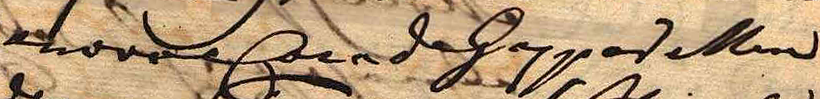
a nova e Caza de Gaspar Men
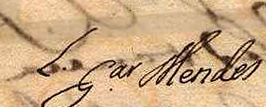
L. G.ar Mendes
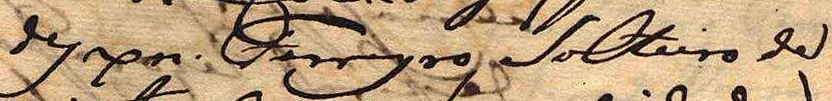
des xn. Ferreyro, Solteiro de
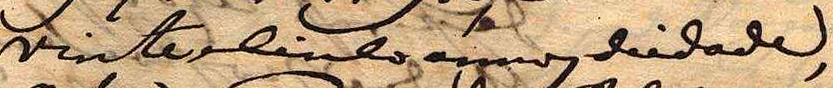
vinte e Cinco annos de idade,
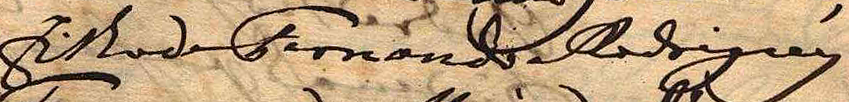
filho de Fernando Rodrigues
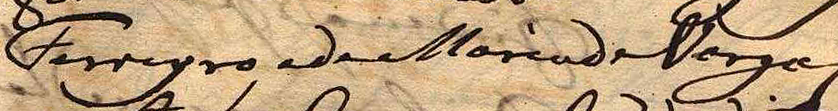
Ferreyro, e de Maria da Vargas
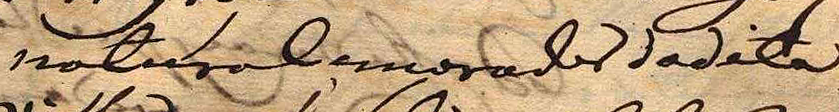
natural e morador da dita
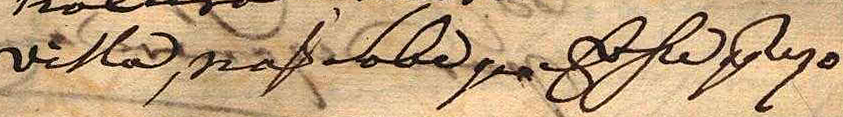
villa naõ sabe que fosse pRezo
